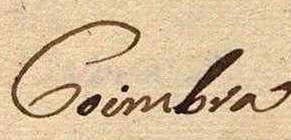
Coimbra
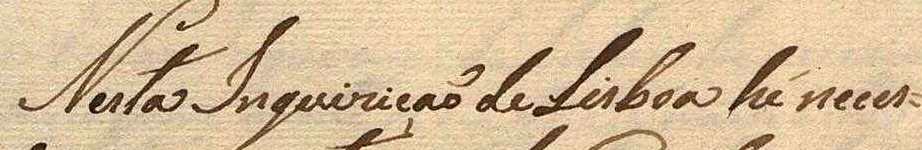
Nesta Inquiziçaõ de Lisboa hé neces
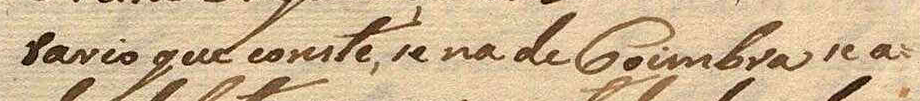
sario que conste, se na de Coimbra, se a
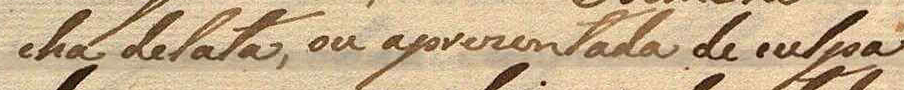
cha delata, ou aprezentada de culpa
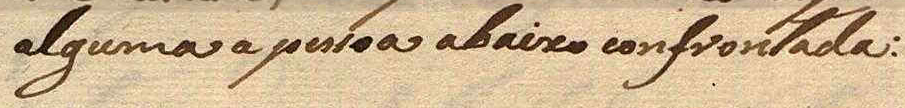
alguma a pessoa abaixo confrontada:
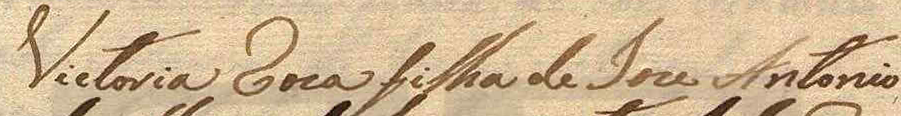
Victoria Roza filha de Ioze Antonio
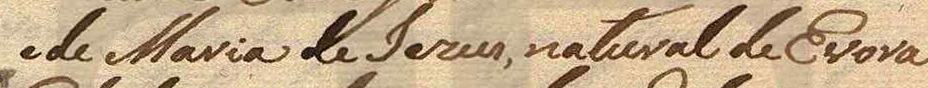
e de Maria de Iezus, natural de Evora
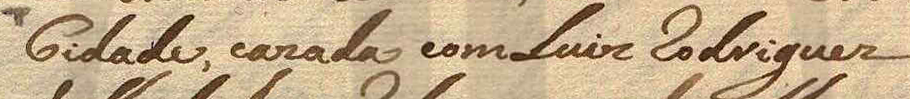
Cidade, cazada com Luiz Rodriguez
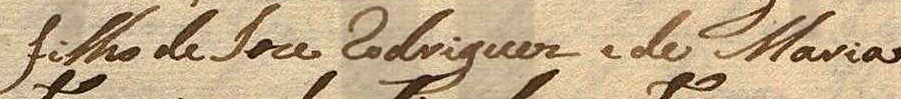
filho de Ioze Rodriguez, e de Maria
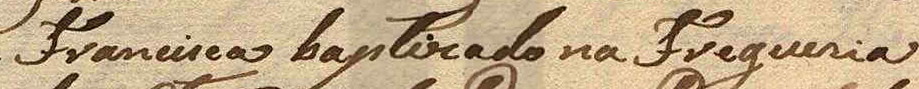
Francisca baptizado na Freguezia
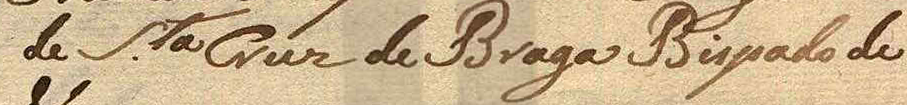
de S.ta Cruz de Braga Bispado de
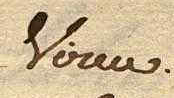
Vizeu.
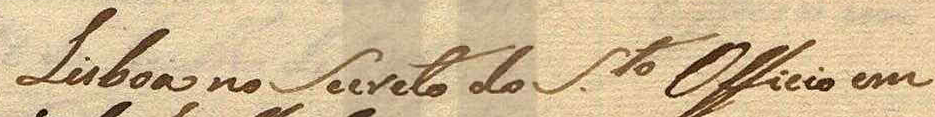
Lisboa no Secreto do S.to Officio em
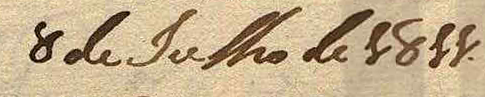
8 de Iulho de 1811.
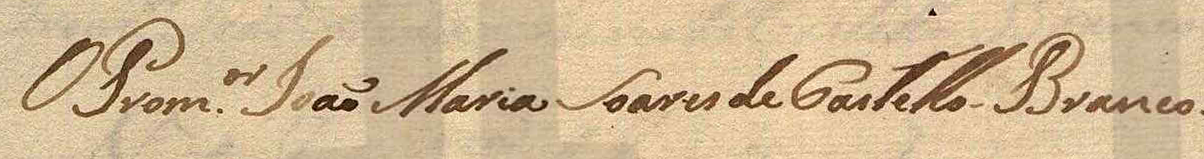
O Prom.or Ioaõ Maria Soares de Castello-Branco.
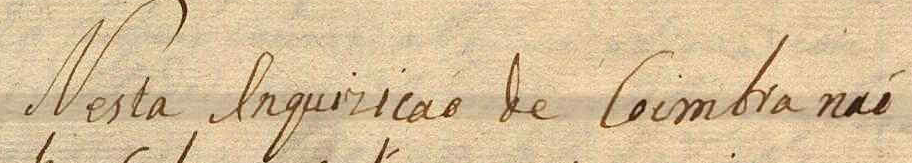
Nesta Inquiziçaõ de Coimbra naõ
